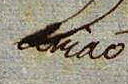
auiaõ
